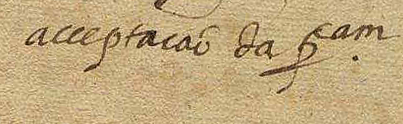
aceptaçaõ da ꝓçam.
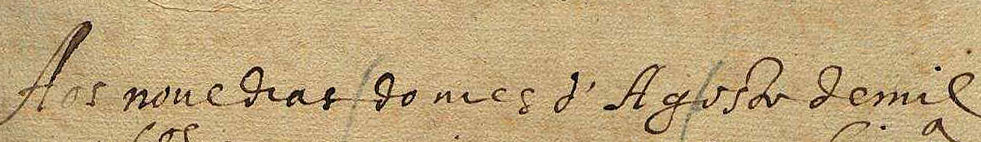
Aos noue dias do mes d'Agosto de mil
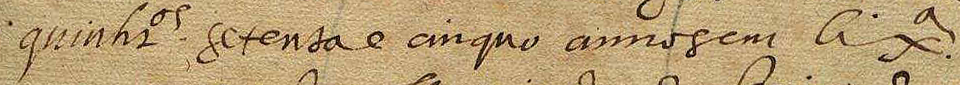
quinhtos. setenta e cinquo annos em lixa.
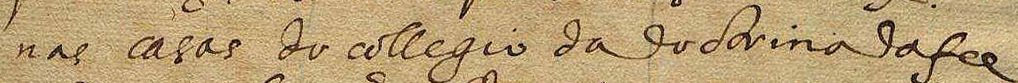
nas casas do collegio da doctrina da fee
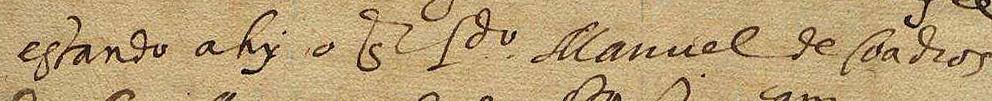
estando ahy o s̄or Ldo. Manuel de Coadros
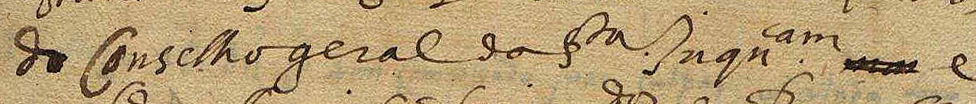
do Conselho geral da sta. Inqu.çam ma e
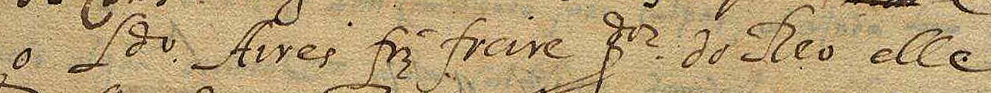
o Ldo. Aires frz̄ freire ꝓdor. do Reo elle
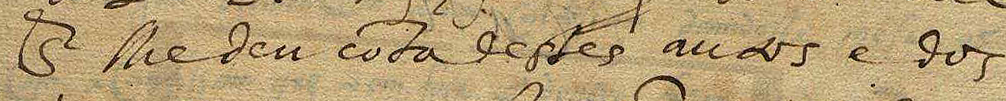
sor lhe deu cōta destes autos e dos
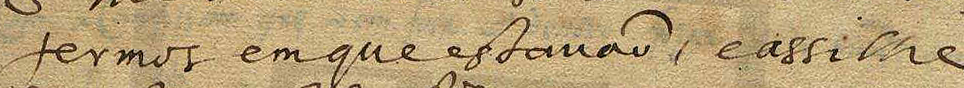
termos em que estauaõ / e assi lhe
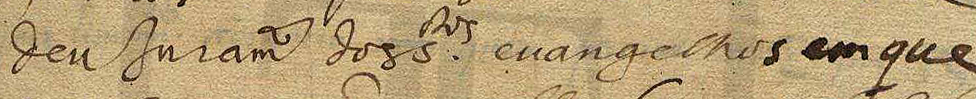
deu Juramto dos stos. euangelhos em que
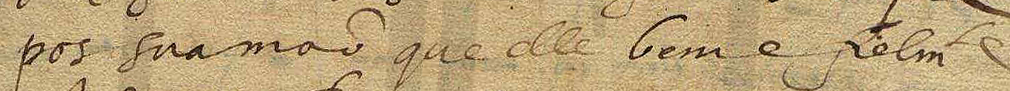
pos sua maõ que elle bem e fielmte
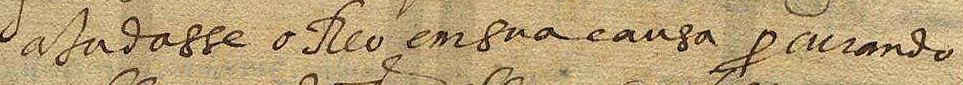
aIudasse o Reo em sua causa ꝓcurando
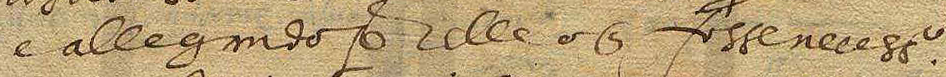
e allegando por elle o q̄ fosse necesso.
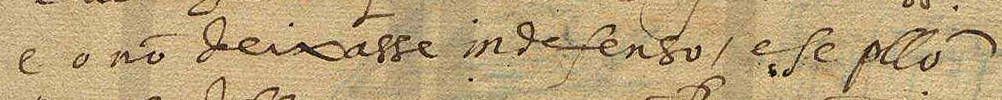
e o nō deixasse indefenso / e se pllō
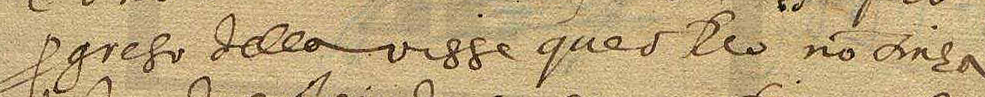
ꝓgreso della visse que o Reo nō tinha
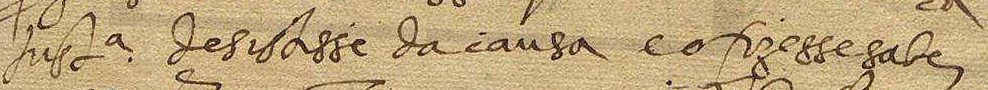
Iusta. desistisse da causa e o fizesse saber
